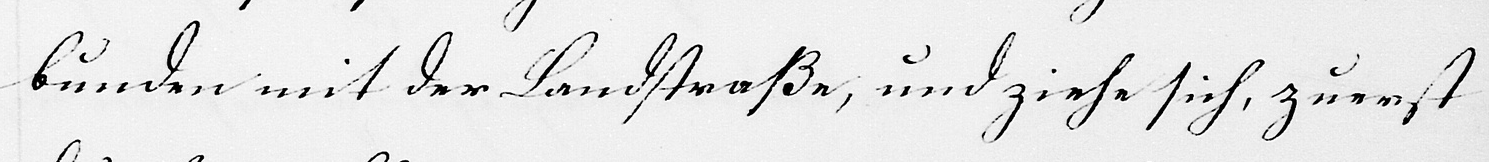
bunden mit der Landstraße, und ziehe sich, zuerst
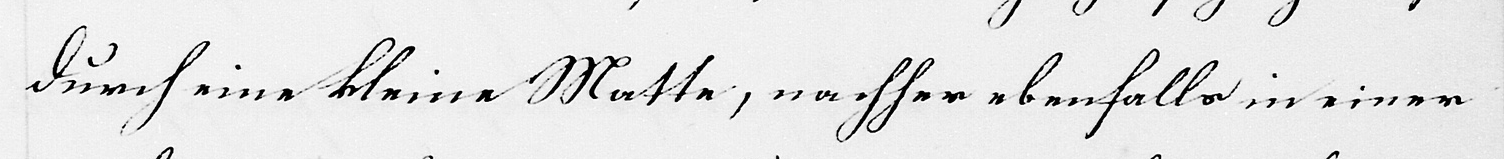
durch eine kleine Matte, nachher ebenfalls in einer
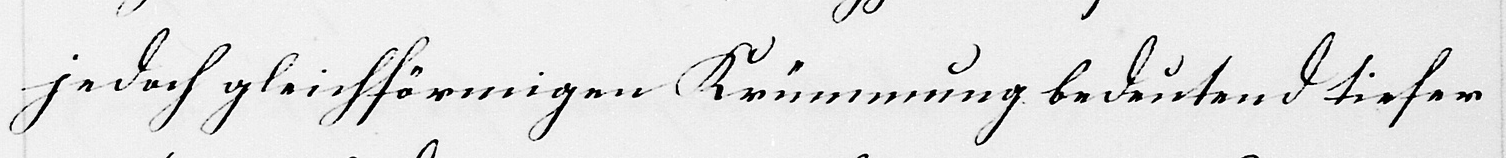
jedoch gleichförmigen Krümmung bedeutend tiefer
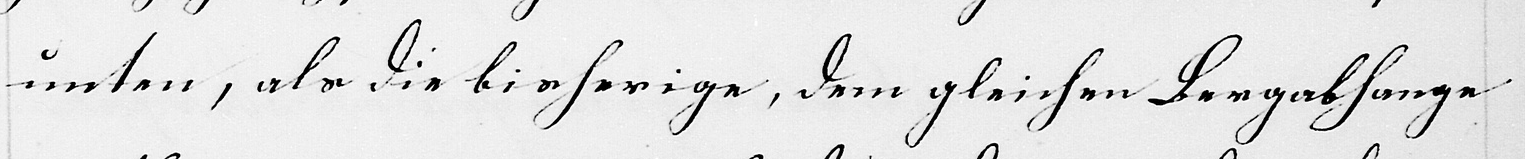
unten, als die bisherige, dem gleichen Bergabhange
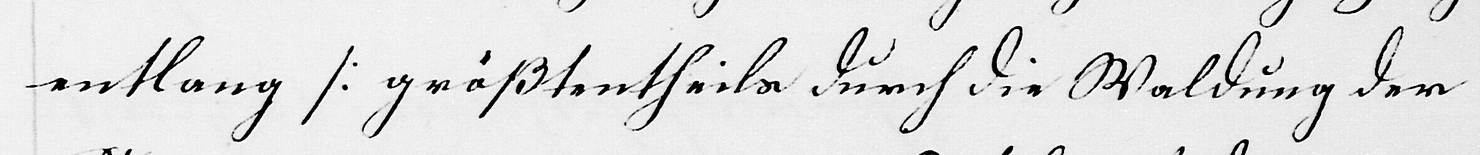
entlang [größtentheils durch die Waldung der
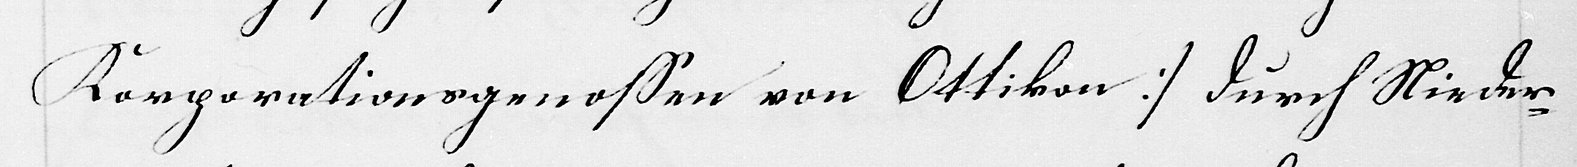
Korporationsgenoßen von Ottikon] durch Nieder¬
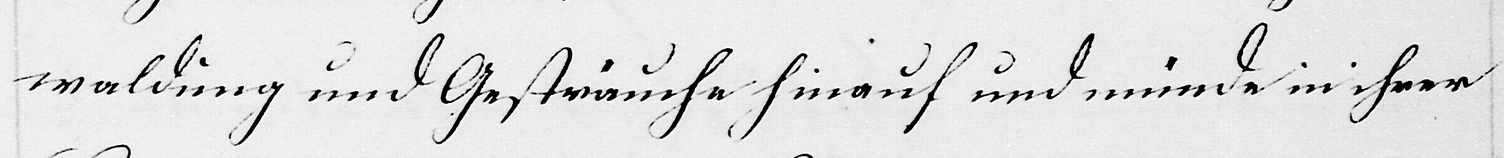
waldung und Gesträuche hinauf und münde in ihrer
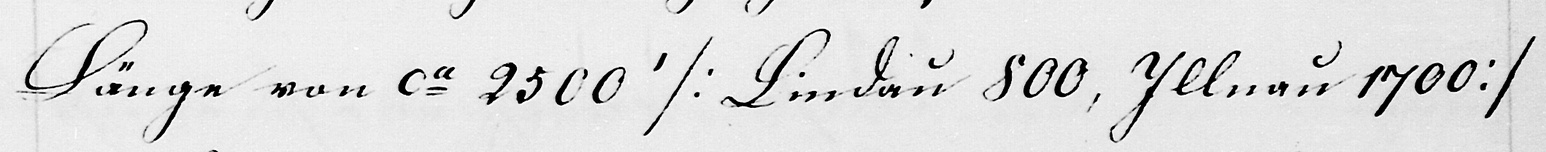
Länge von ca 2500 [Fuss] [Lindau 800, Illnau 1700]
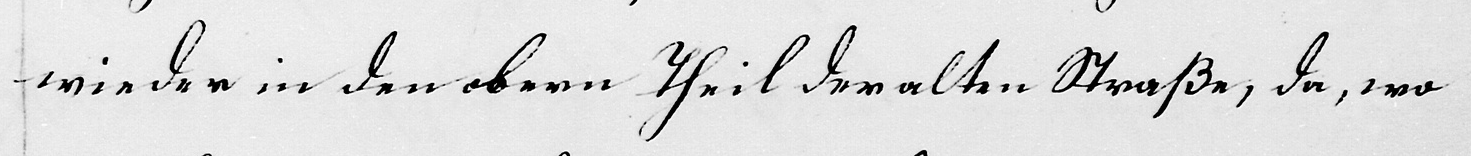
wieder in den obern Theil der alten Straße, da, wo
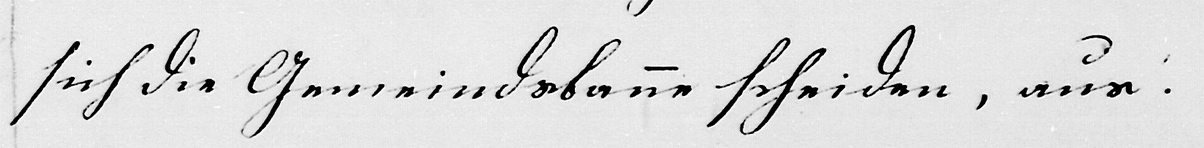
sich die Gemeindsbanne scheiden, aus.
